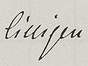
Bericht
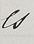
ist,
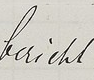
wie es
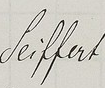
sich nun
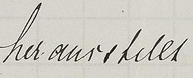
herausstellt
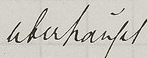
überhaupt
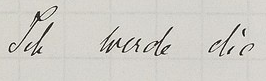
Ich werde die
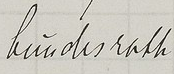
Bundesrath
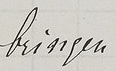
bringen.
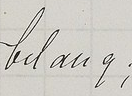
Weiteres
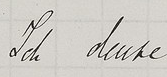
von Belang;
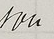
die sehr
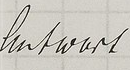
erfreuliche
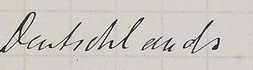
Deutschlands
